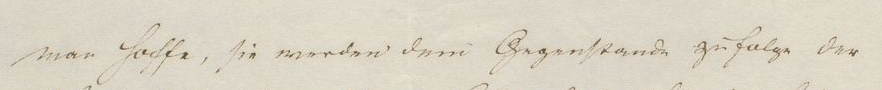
man hoffe, sie werden dem Gegenstande zufolge der
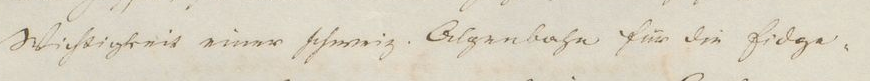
Wichtigkeit einer schweiz. Alpenbahn für die Eidge-
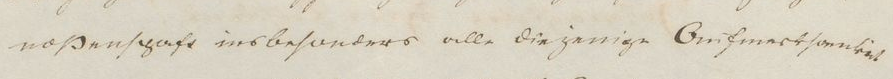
noßenschaft insbesonders alle diejenige Aufmerksamkeit
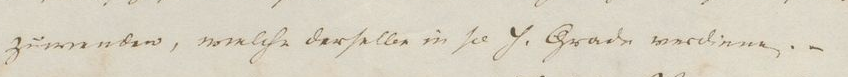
zuwenden, welche derselbe in so h. Grade verdienen. –
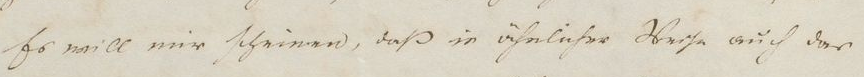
Es will mir scheinen, daß in ähnlicher Weise auch das
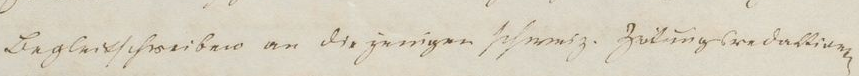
Begleitschreiben an diejenigen schweiz. Zeitungsredaktionen,
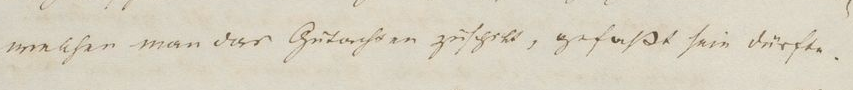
welchen man das Gutachten zuschikt, gefaßt sein dürfte.
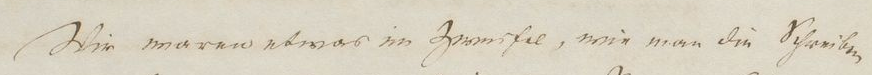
Wir waren etwas im Zweifel, wie man die Schreiben
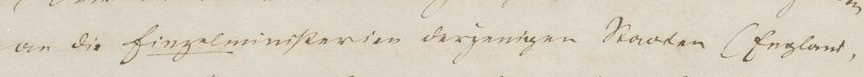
an die Einzelministerien derjenigen Staaten (England,
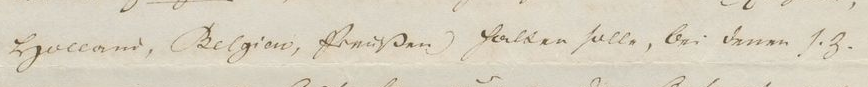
Holland, Belgien, Preußen) halten soll, bei denen s. Z.
